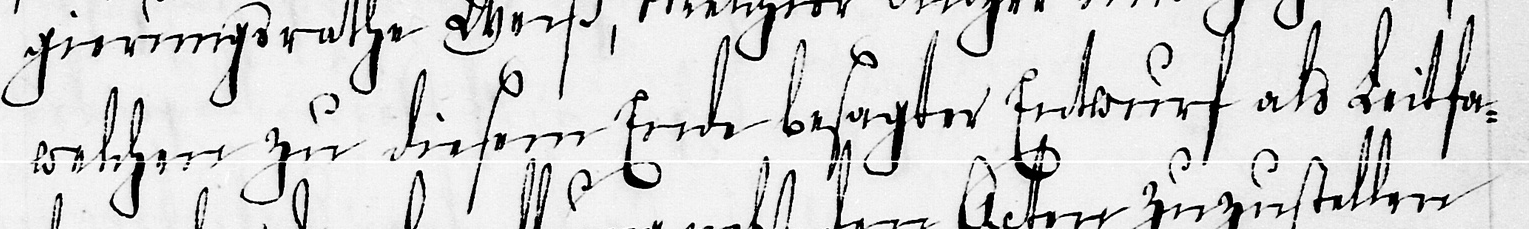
welchen zu diesem Ende besagter Entwurf als Leitfa¬
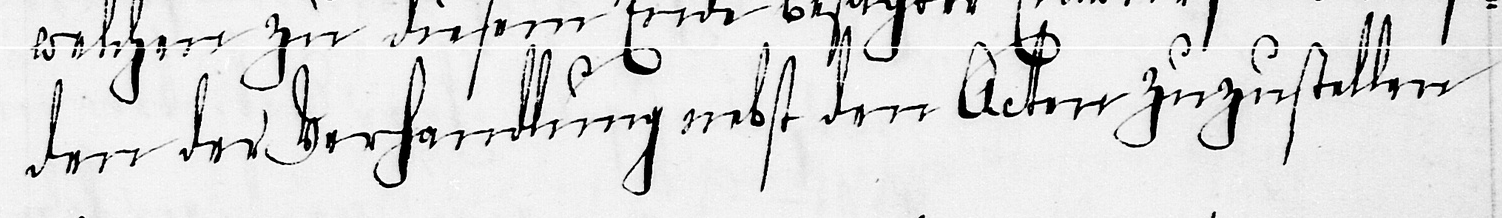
den der Verhandlung nebst den Acten zuzustellen
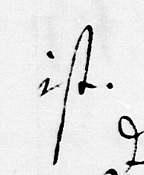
ist.
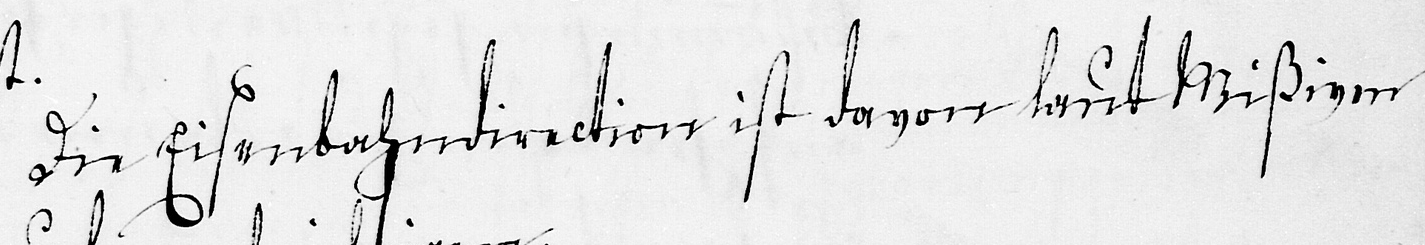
Die Eisenbahndirection ist davon laut Mißiven
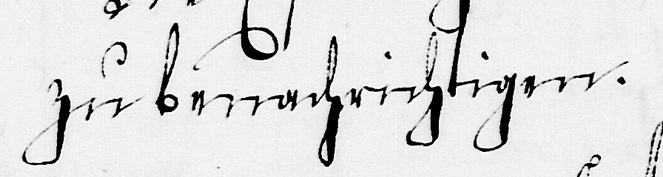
zu benachrichtigen.
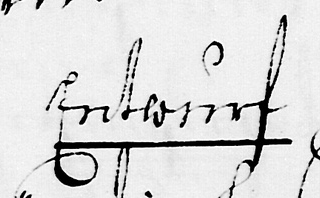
Entwurf
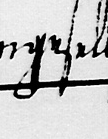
der
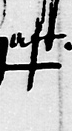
ft.
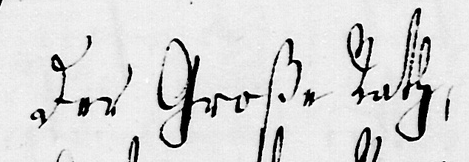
Der Große Rath,
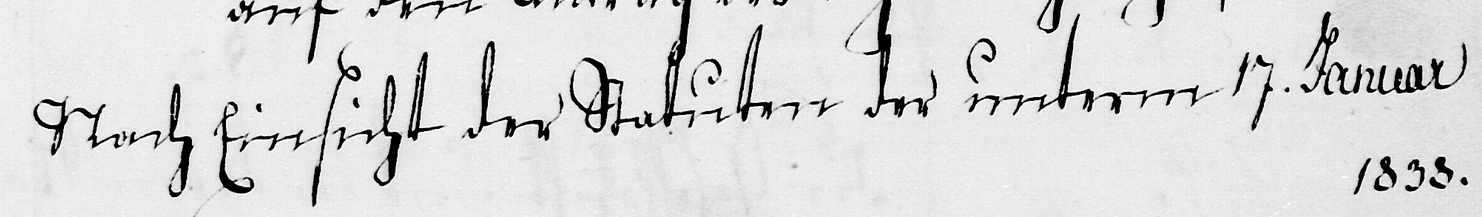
Nach Einsicht der Statuten der unterm 17. Januar
